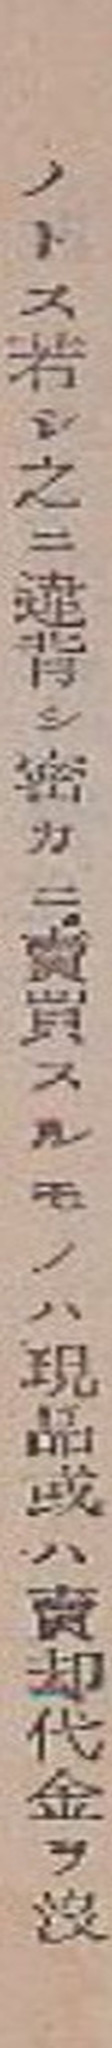ノトス若シ之ニ違背シ密カニ売買スルモノハ現品或ハ売却代金ヲ没

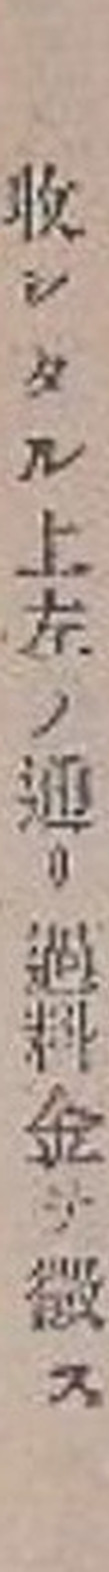収シタル上左ノ通リ過料金ヲ徴ス
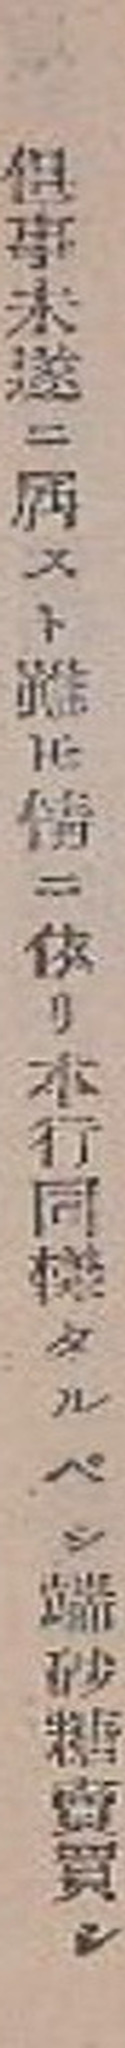但事未遂ニ属スト雖トモ情ニ依リ本行同様タルベシ端砂糖賣買シ
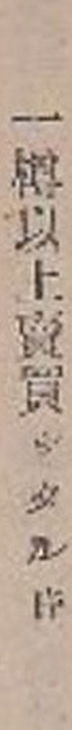一樽以上賣買シタルトキ
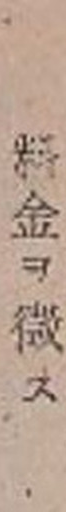料金ヲ徴ス
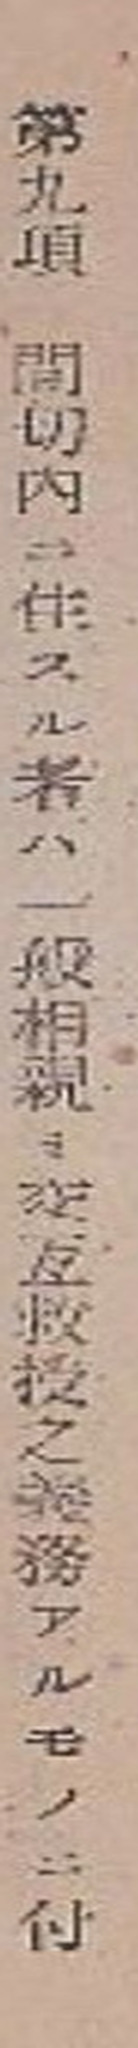第九項間切内ニ住スル者ハ一般相親ミ交互救授之義務アルモノニ付
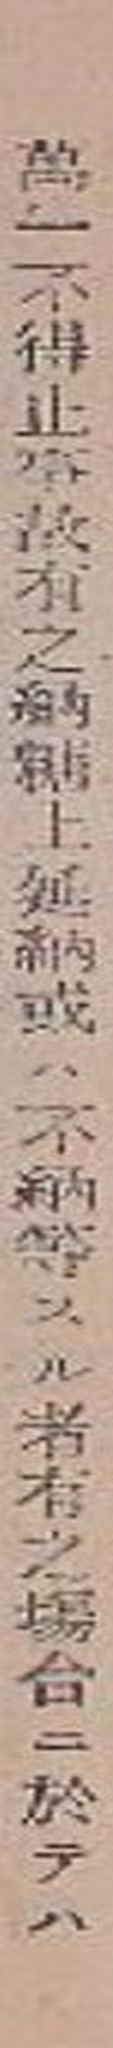萬一不得止事故有之納糖上延納或ハ不納等スル者有之場合ニ於テハ

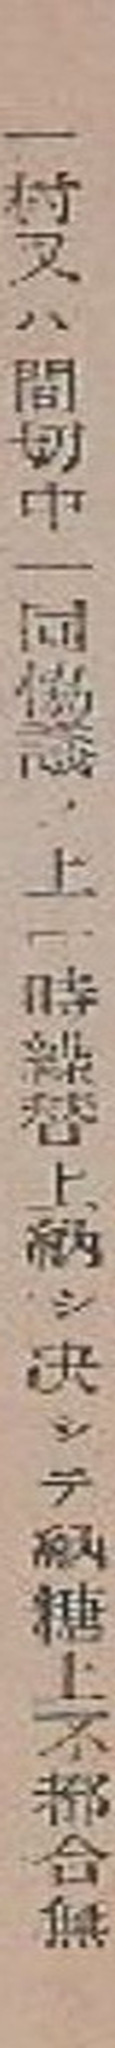一村又ハ間切中一同協議ノ上一時繰替上納シ決シテ納糖上不都合無
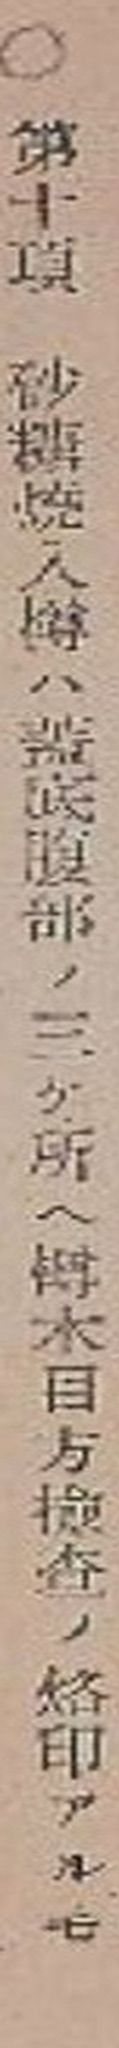第十項砂糖焼入樽ハ蓋底腹部ノ三ヶ所ヘ樽木目方撿査ノ烙印アルモ
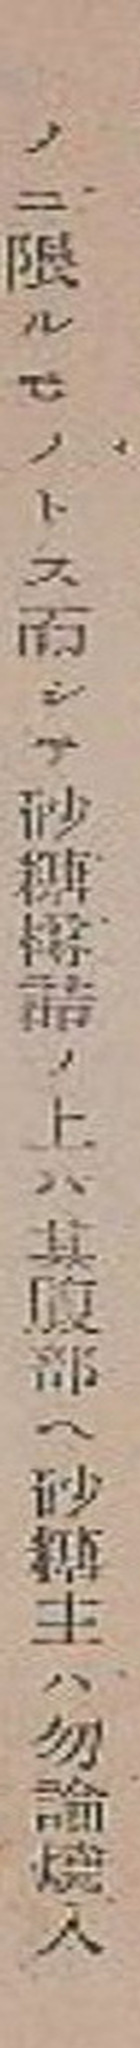ノニ限ルモノトス而シテ砂糖樽詰ノ上ハ其腹部ヘ砂糖主ハ勿論焼入
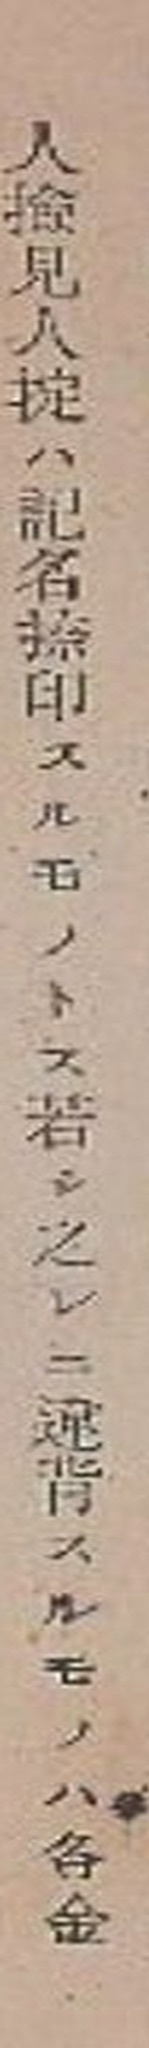人撿見人掟ハ記名捺印スルモノトス若シ之レニ違背スルモノハ各金
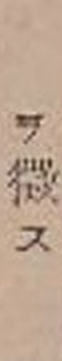ヲ徴ス
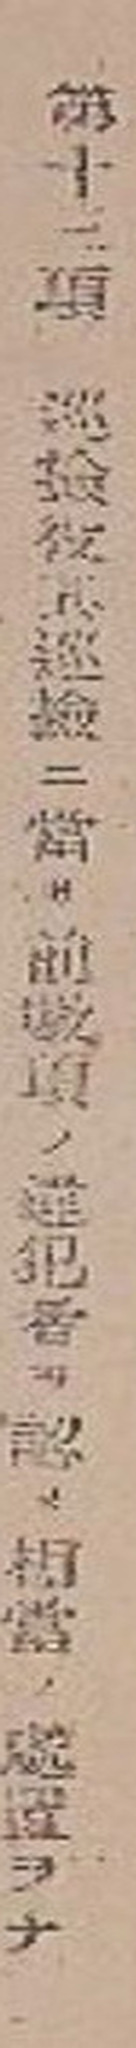第十三項巡撿役其巡撿ニ當リ前數項ノ違犯者ヲ認メ相當ノ處置ヲナ
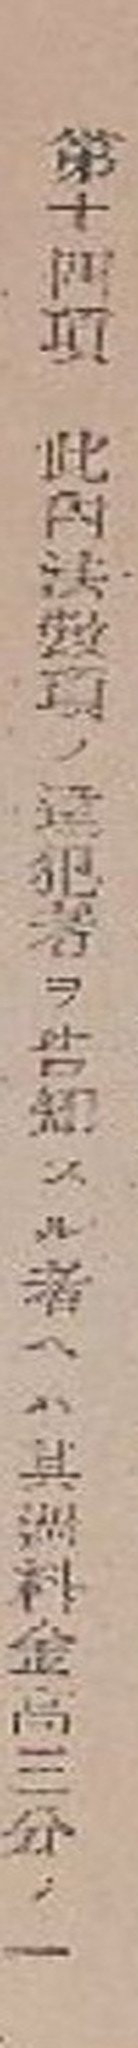第十四項此内法數項ノ違犯者ヲ告知スル者ヘハ其過料金高三分ノ一
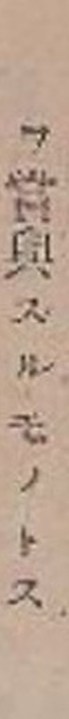ヲ賞與スルモノトス
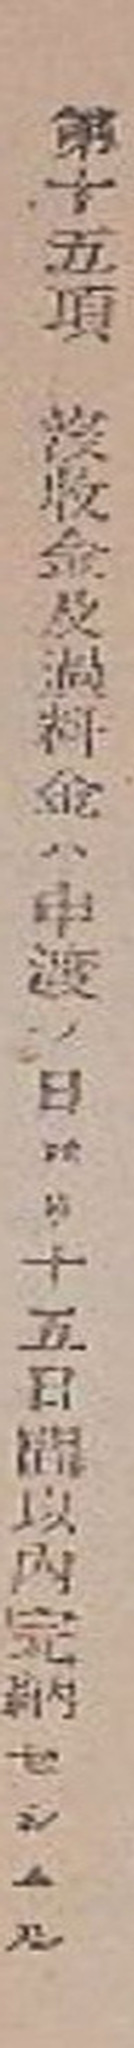第十五項没收金及過料金ハ申渡ノ日ヨリ十五日間以内完納セシムル
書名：製糖取締旧慣内法
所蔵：University of the Ryukyus Library
